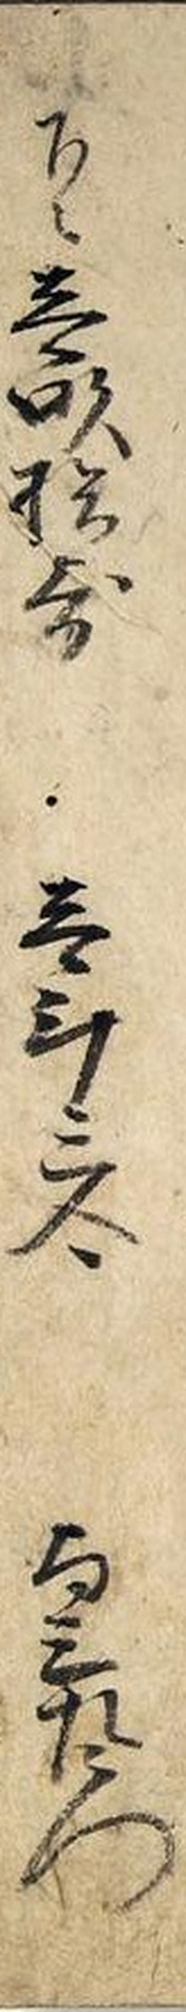下々壱畝拾歩壱斗三合与三左衛門

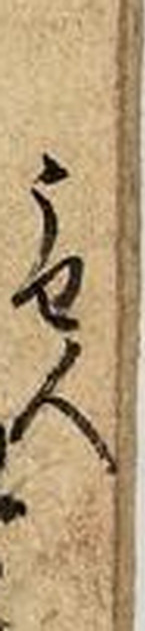うせ人
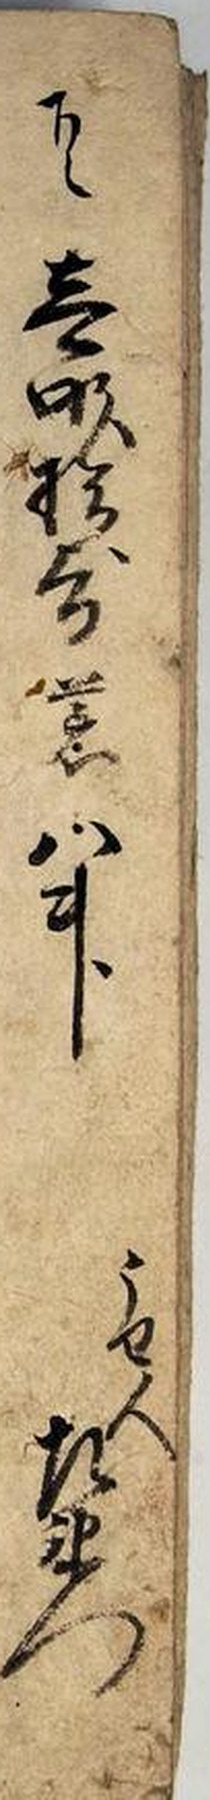下々壱畝拾歩荒八升左衛門
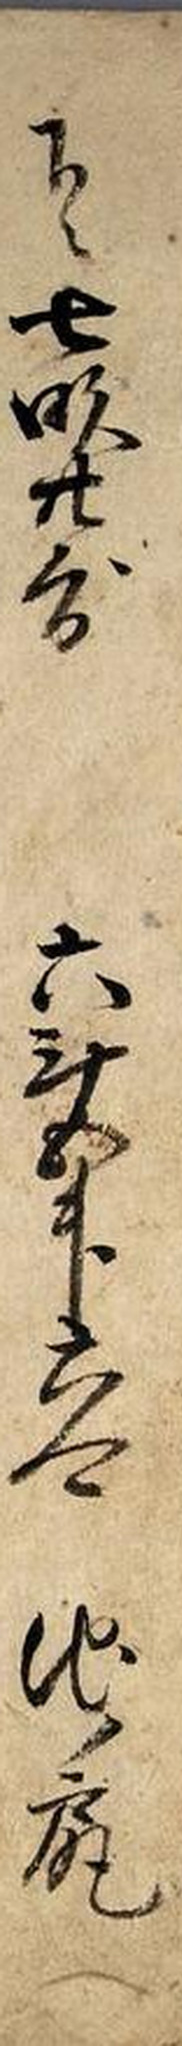下々七畝廿歩六斗五升六合池ノ尻
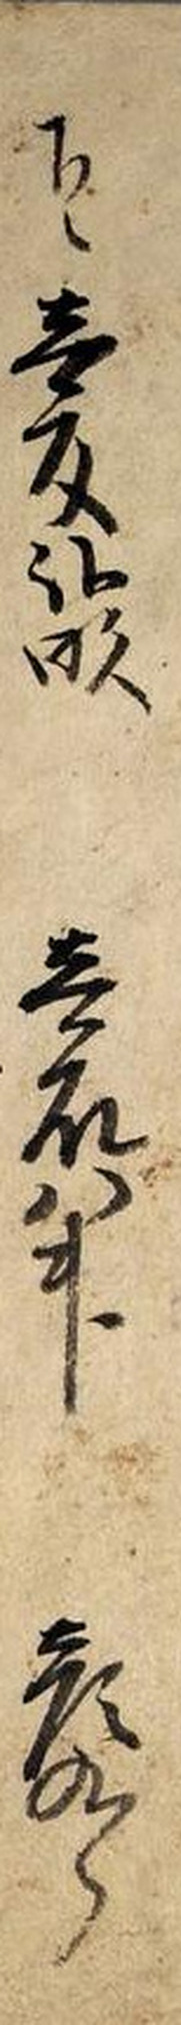下々壱反弐畝壱石八升彦九郎
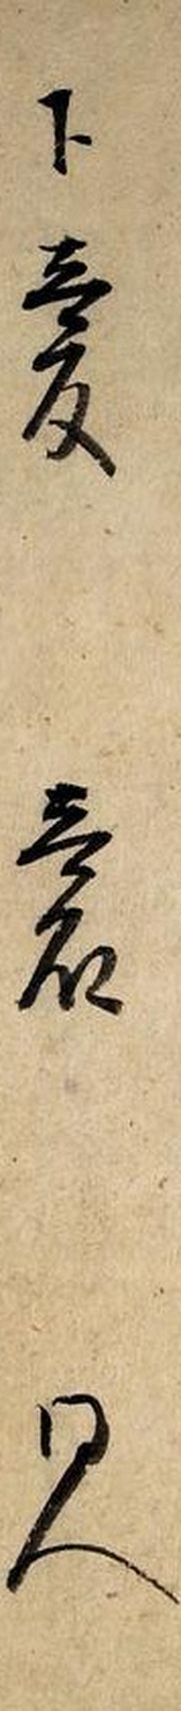下壱反壱石同人
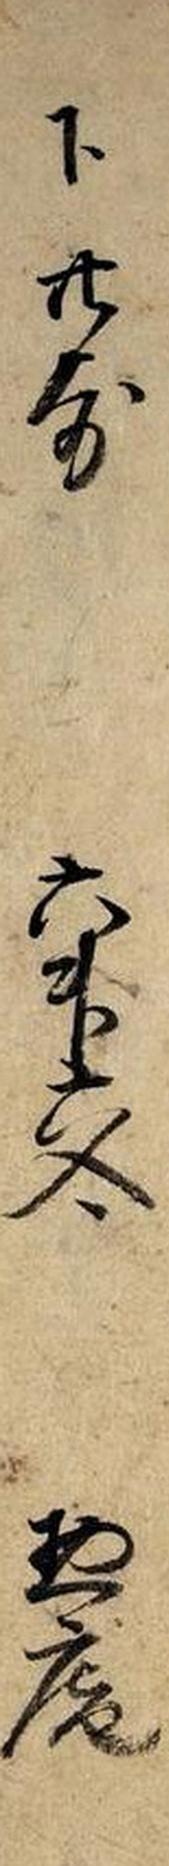下廿歩六升六合惣庵
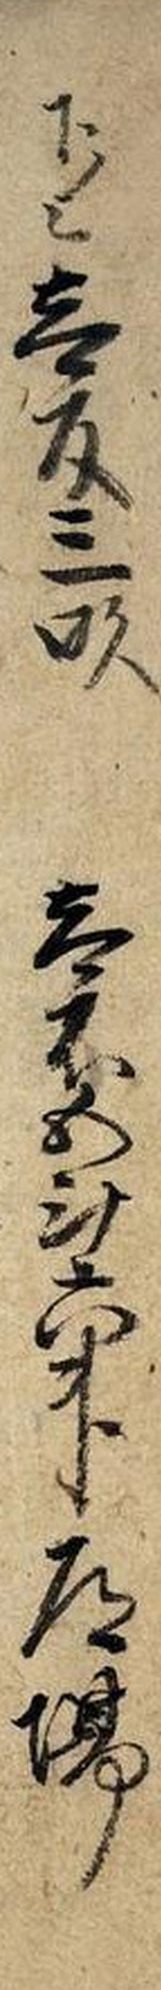下ノ上壱反三畝壱石五斗六升道場
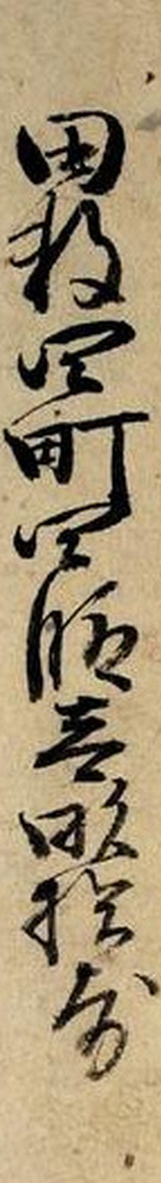田数四町四段壱畝拾歩
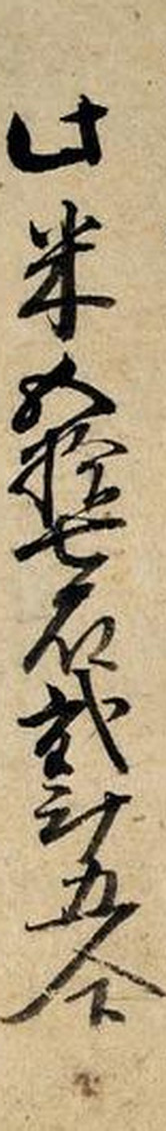此米五拾七石弐斗五合
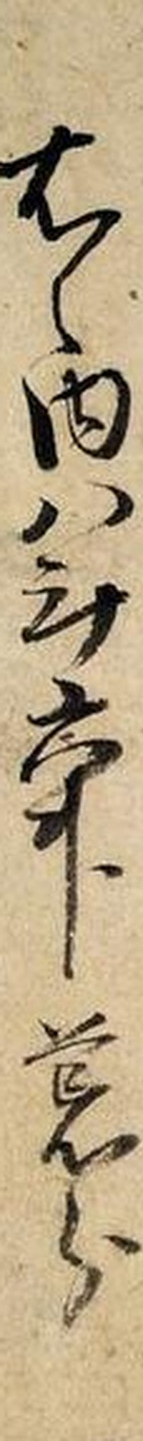右之内八斗六升荒分

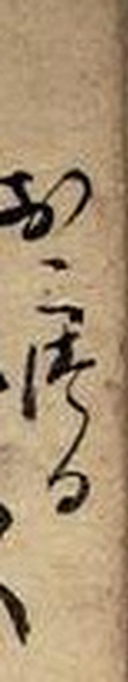おこつる
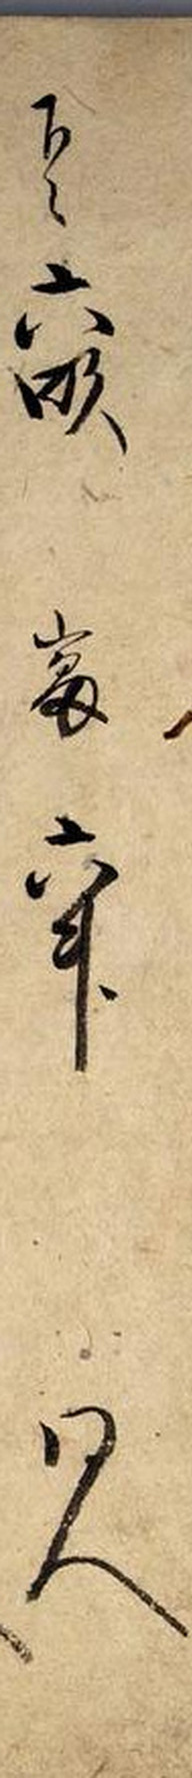下々六畝山畠六升同人
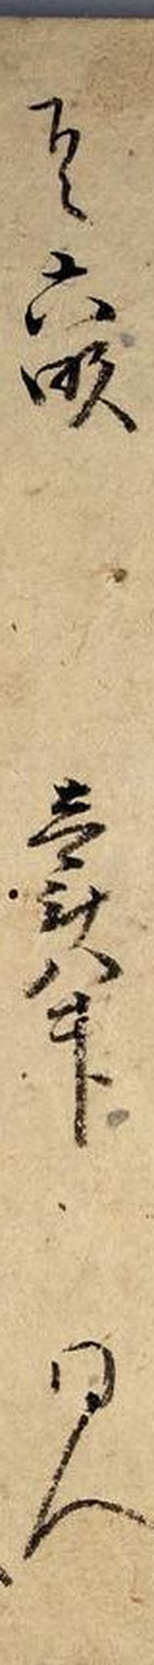下々六畝壱斗八升同人
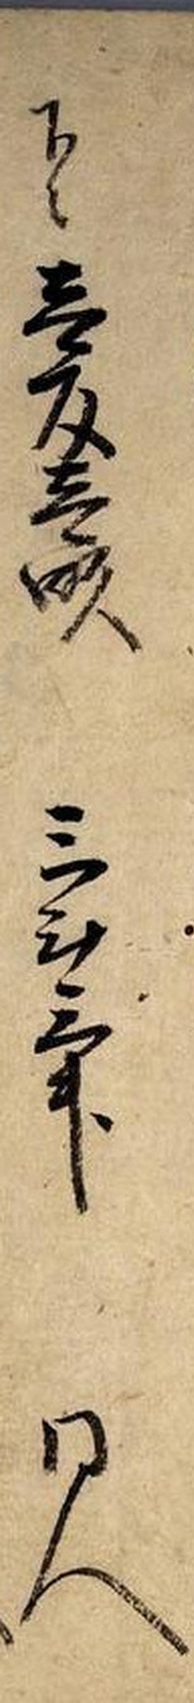下々壱反壱畝三斗三升同人
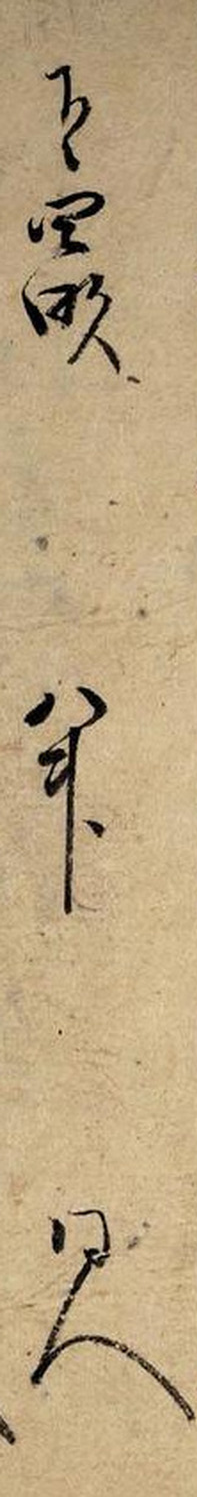下々四畝八升同人
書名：若州三方郡之内世久見浦御検地帳（世久見浦検地帳写）
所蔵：福井県文書館 Fukui Prefectural Archives
